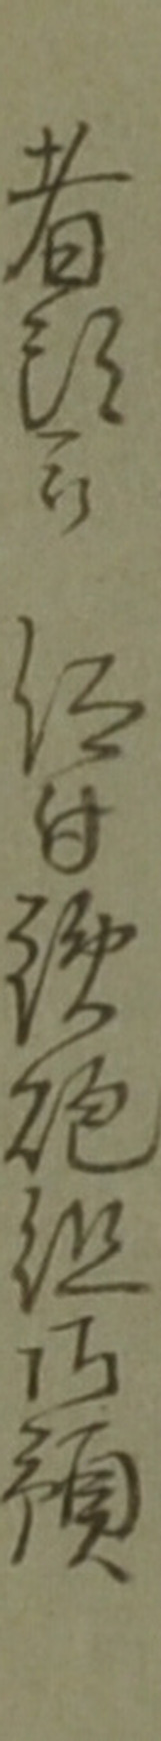者頭被仰付鉄砲組御預
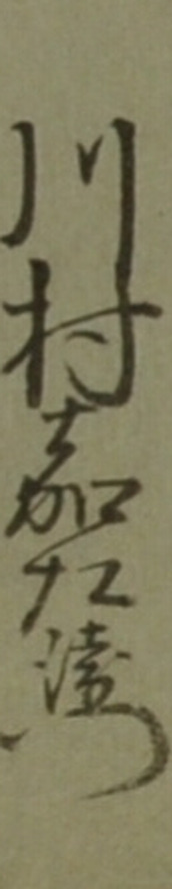川村嘉左衛門
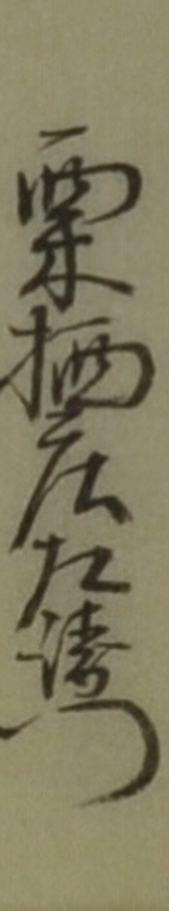栗栖庄左衛門
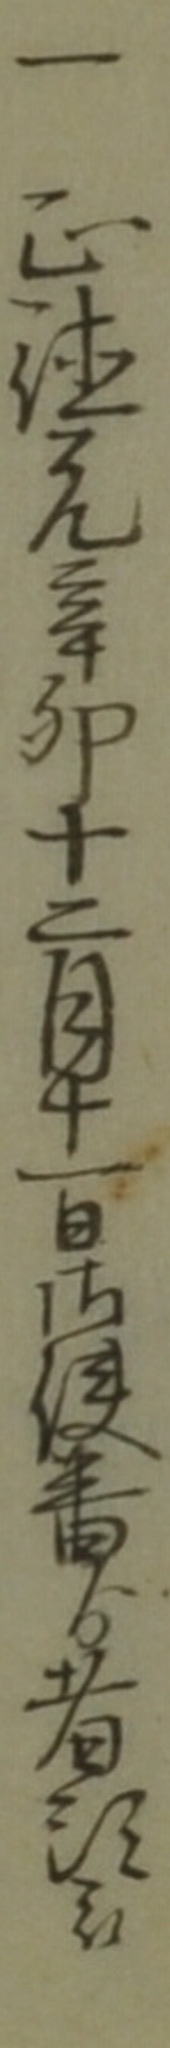一正徳元辛卯十二月十一日御使番ゟ者頭被
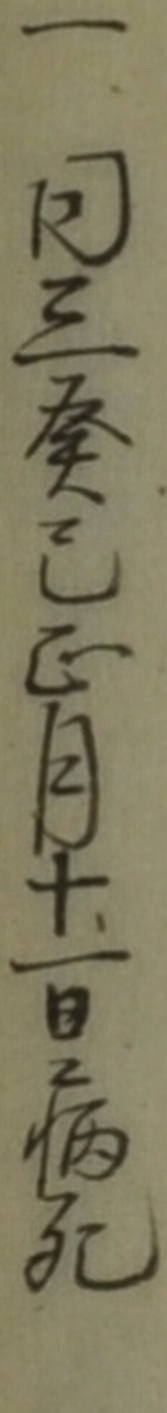一同三癸巳正月十一日病死
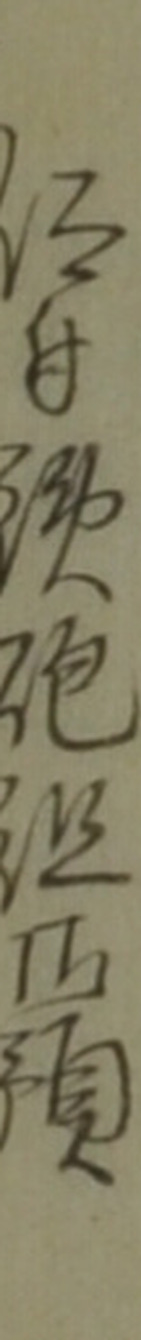仰付鉄砲組御預
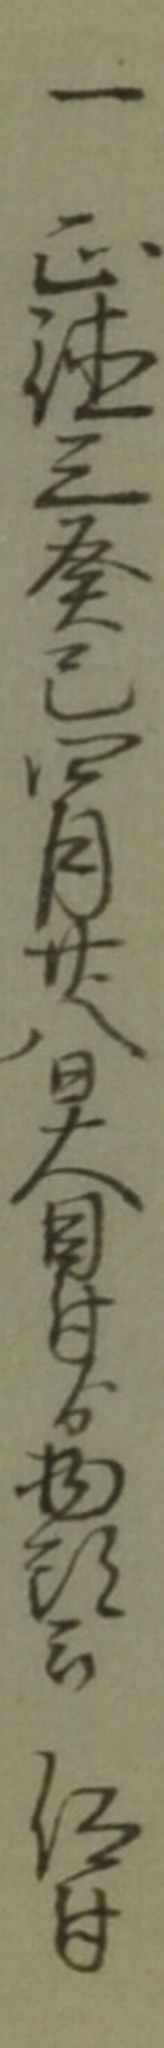一正徳三癸巳四月廿八日大目付ゟ物頭被仰付
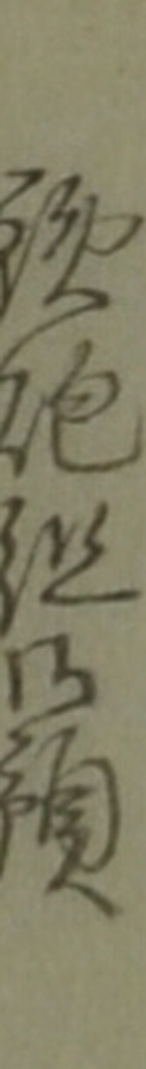鉄砲組御預
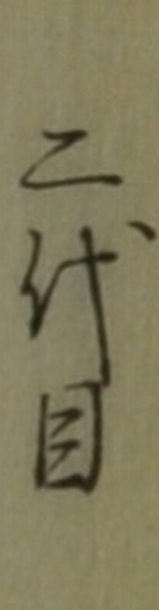二代目
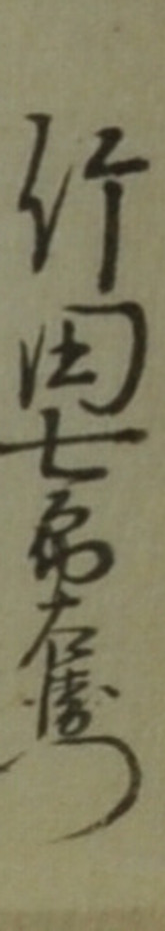竹田七郎右衛門
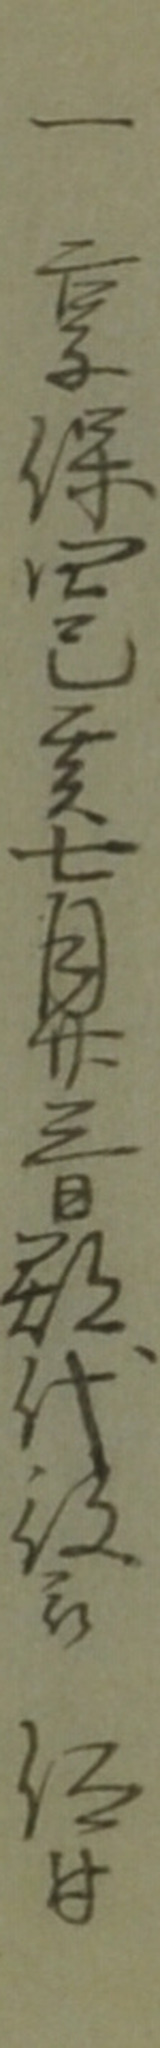一享保四己亥七月廿三日郡代役被仰付
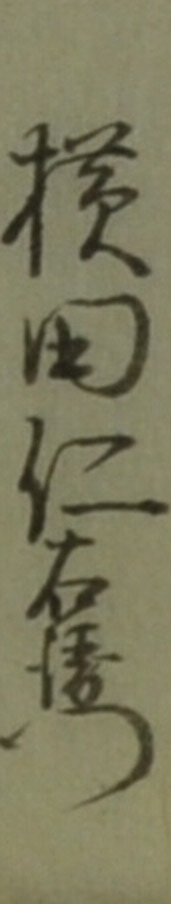横田仁右衛門
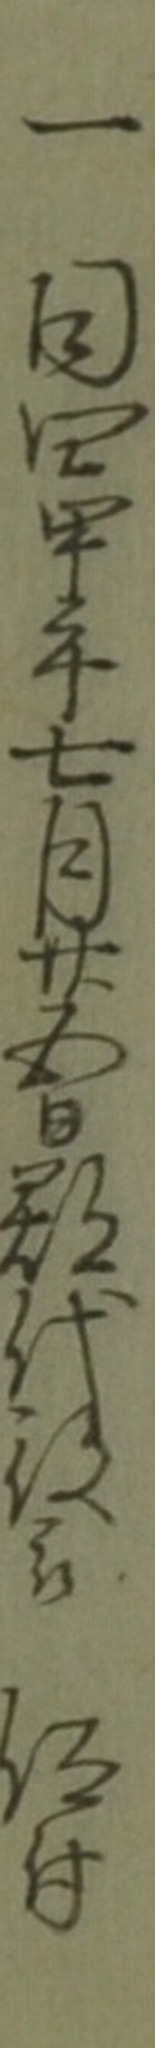一同四甲午七月廿五日郡代役被仰付
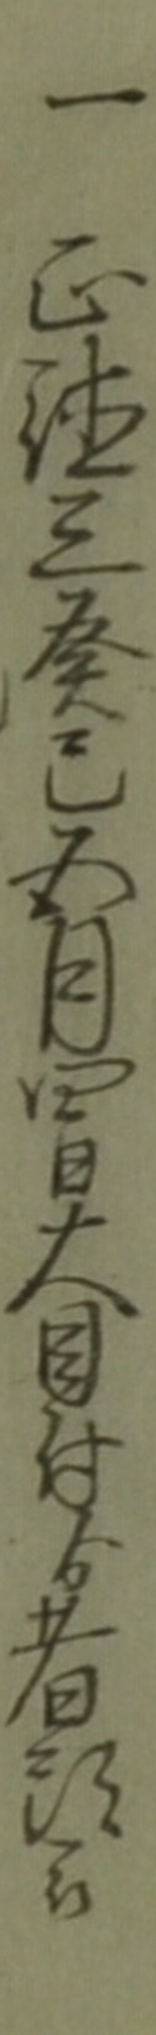一正徳三癸巳五月四日大目付ゟ者頭被
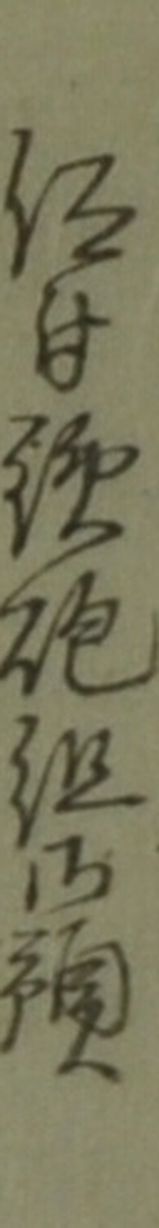仰付鉄砲組御預
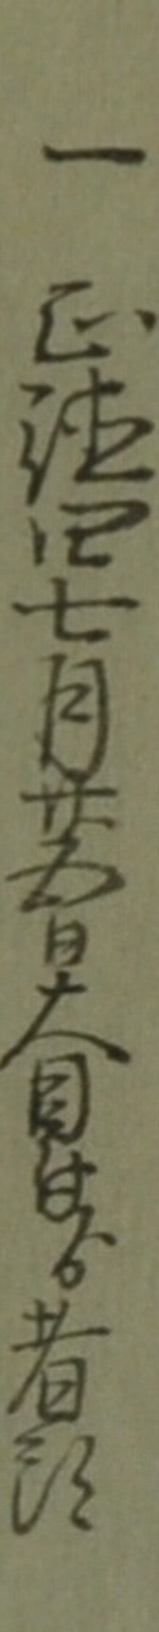一正徳四七月廿五日大目付ゟ者頭
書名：諸御役代々録（二）
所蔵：伊那市立高遠町図書館・合同会社AMANE
